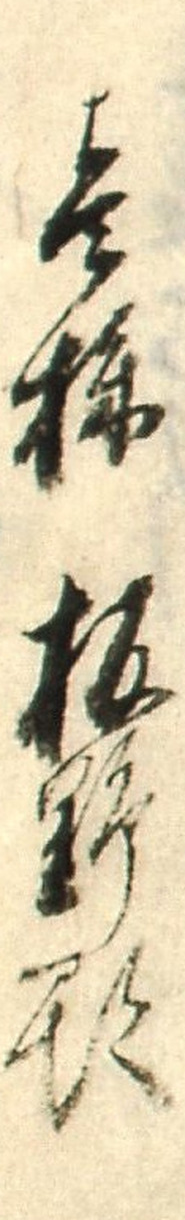壱株板野郡
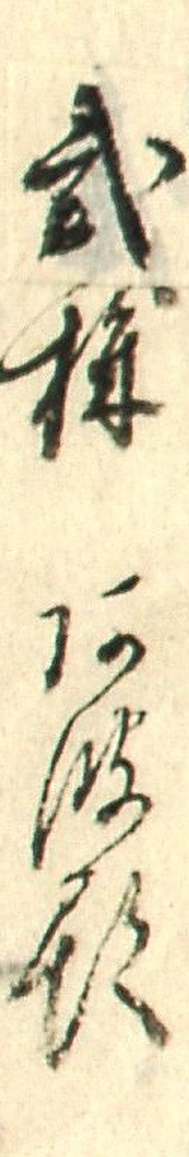弐株名西郡
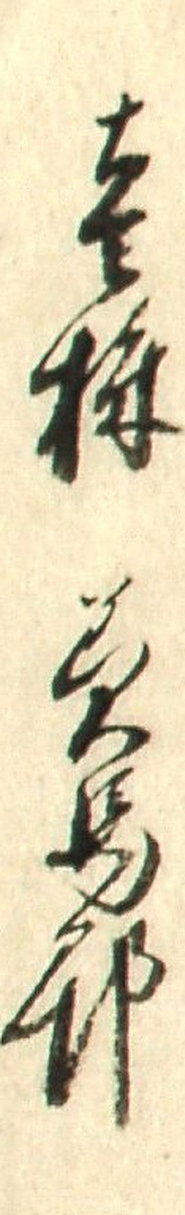弐株美馬郡
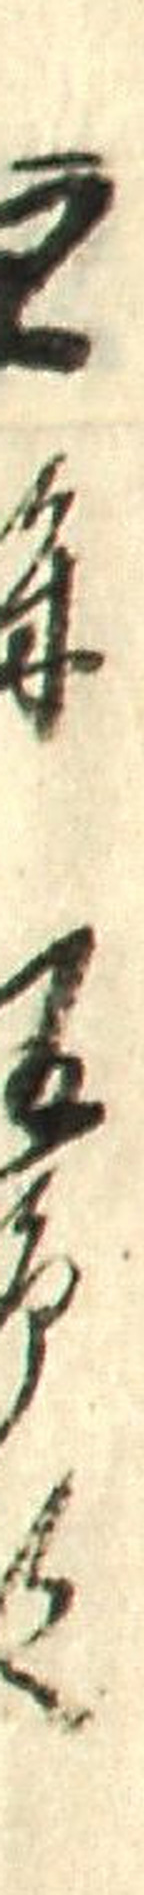壱株板野郡

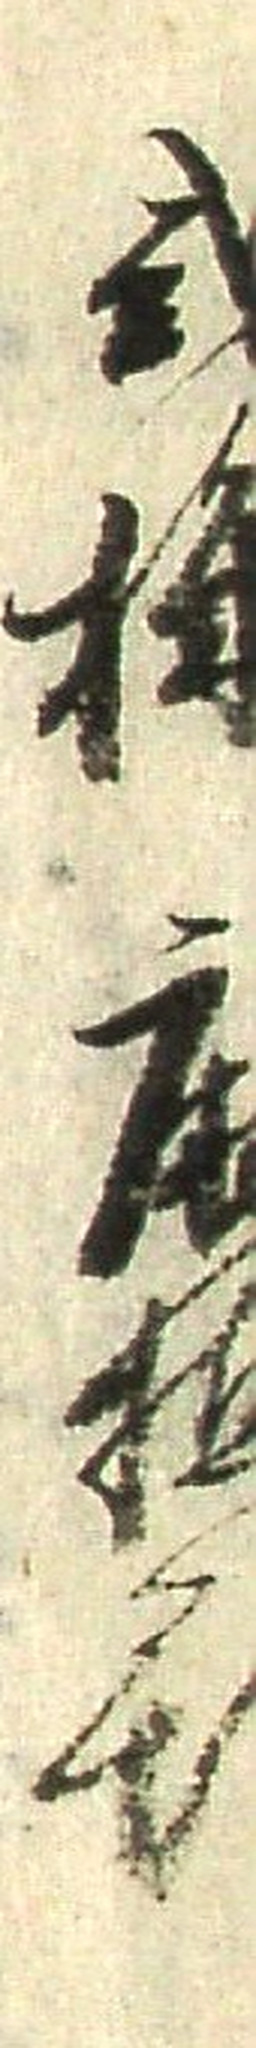壱株麻植郡
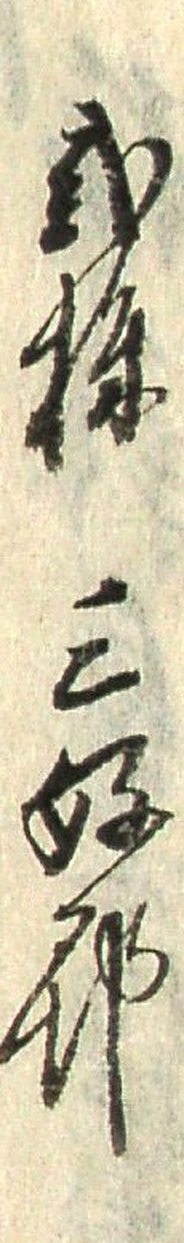弐株三好郡
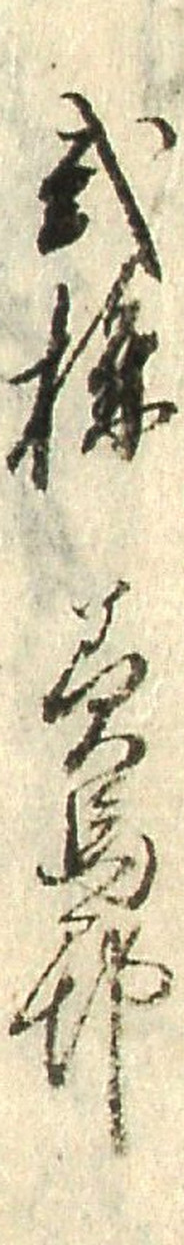壱株美馬郡
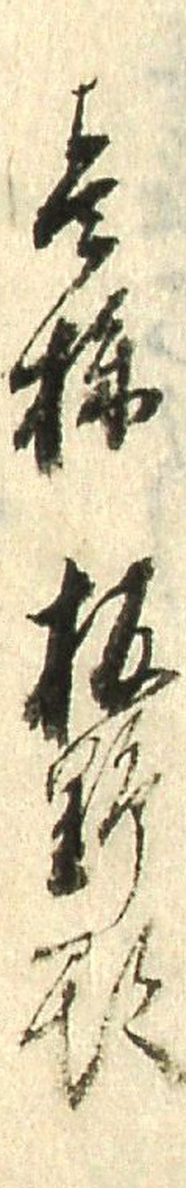壱株板野郡
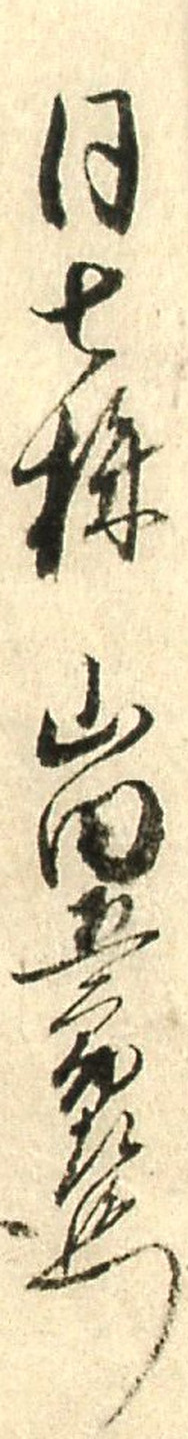同七株山田五郎左衛門
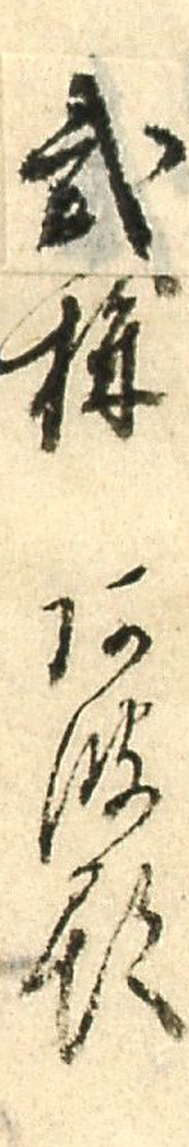弐株阿波郡
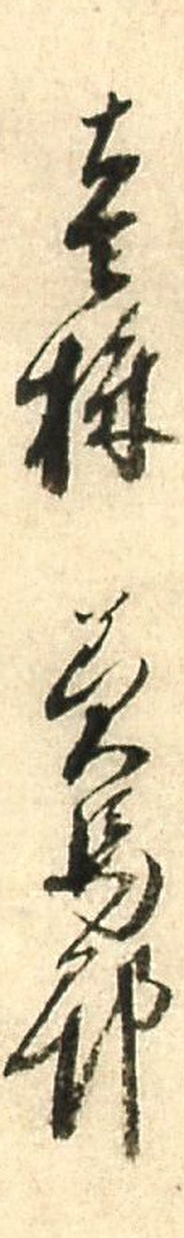壱株美馬郡
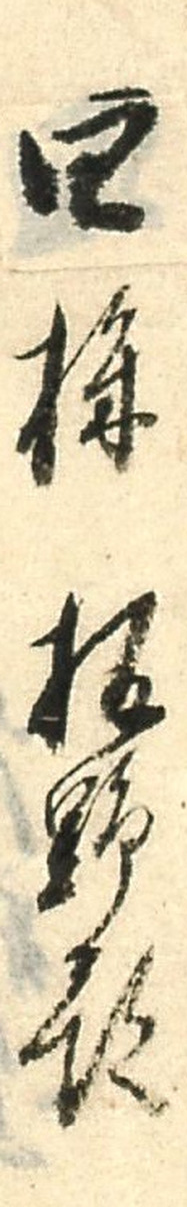四株板野郡
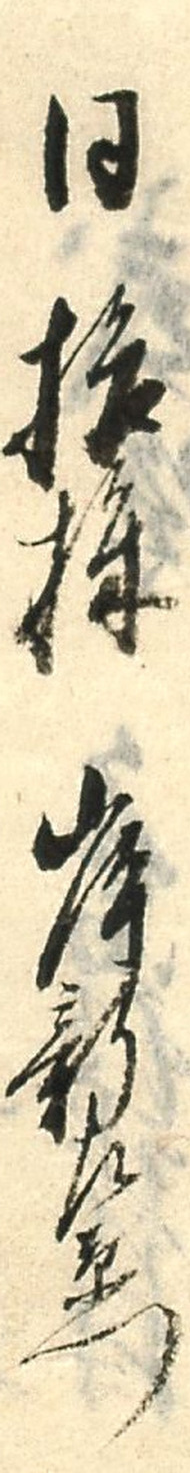同拾株岸新左衛門
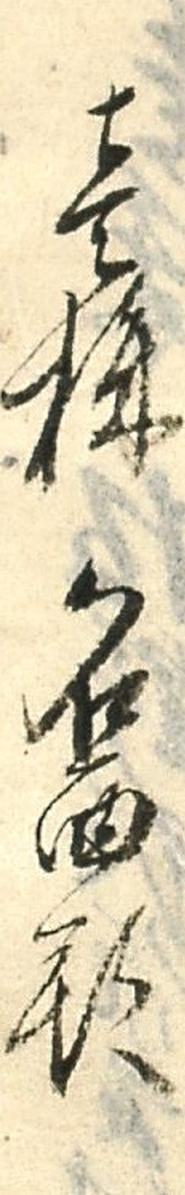壱株名西郡
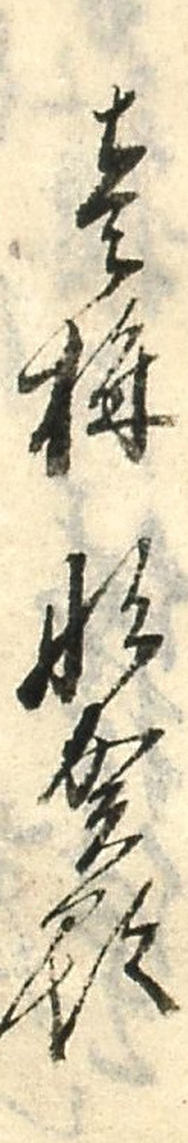壱株那賀郡
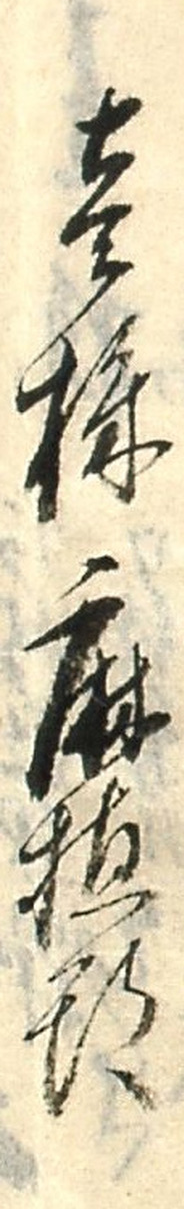壱株麻植郡
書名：南北拾郡造酒屋数並株数調子帳
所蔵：鳴門教育大学 Naruto University of Education
